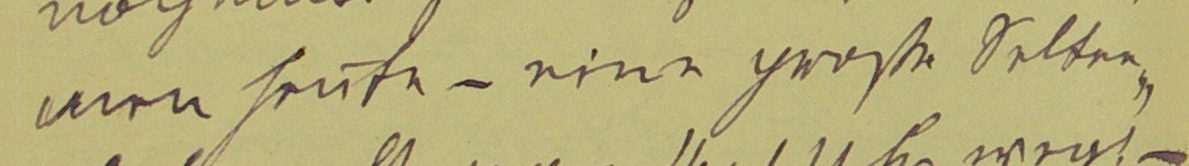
men heute- eine große Selten¬
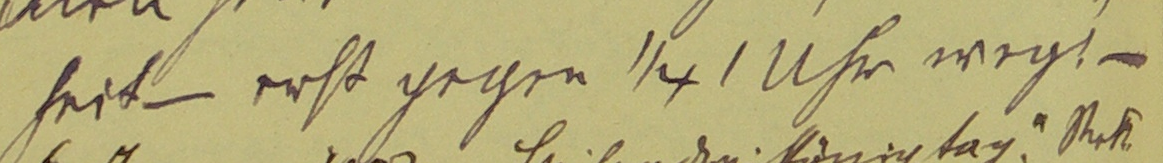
heit – erst um ¼ 1 Uhr weg.-
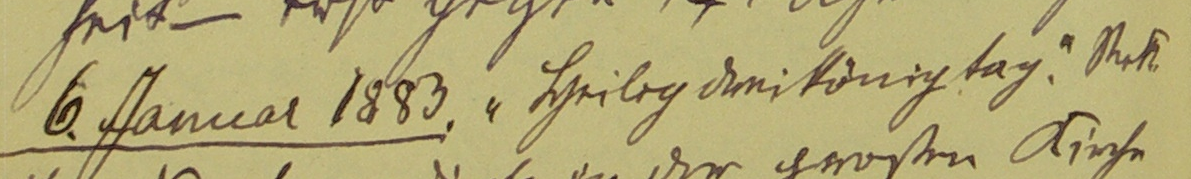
6. Januar1883 „“ Heilig Dreikönigtag „ Pfarrer
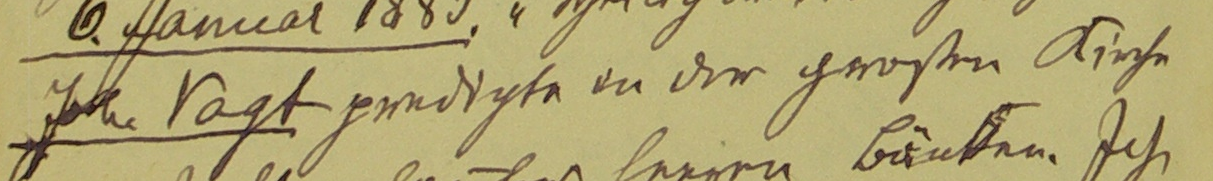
Joh. Vogt predigte in der großen Kirche
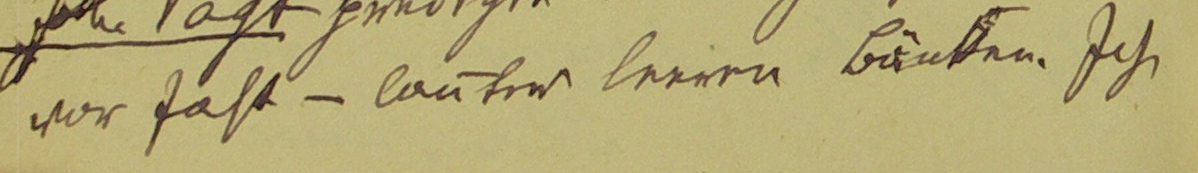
vor fast lauter leeren Bänken. Ich
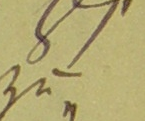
81
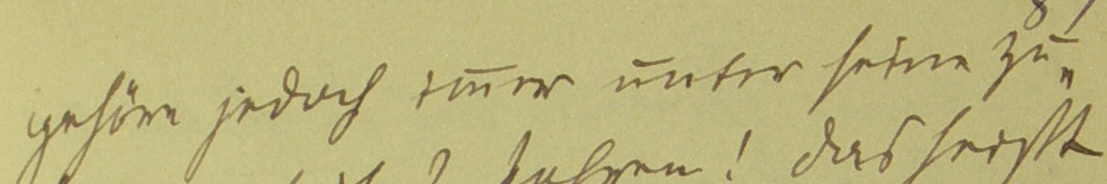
gehöre jedoch immer unter seine Zu¬
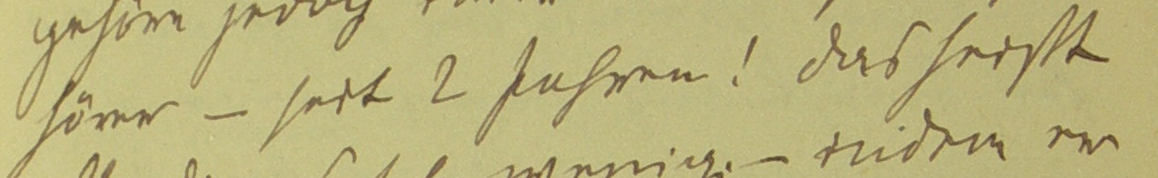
hörer- seit 2 Jahren. Das heißt
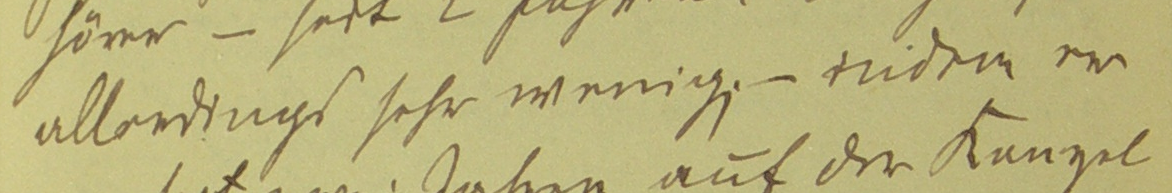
allerdings sehr wenig.-indem er
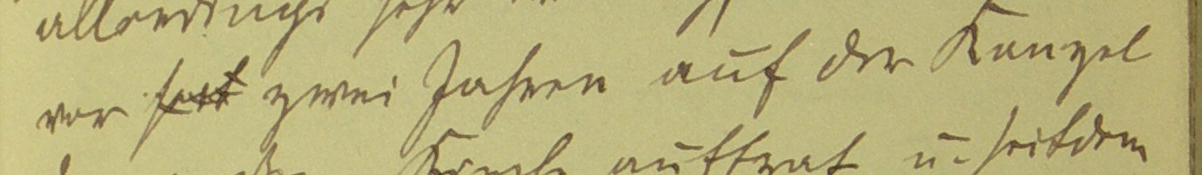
vor 2 Jahre auf der Kanzel
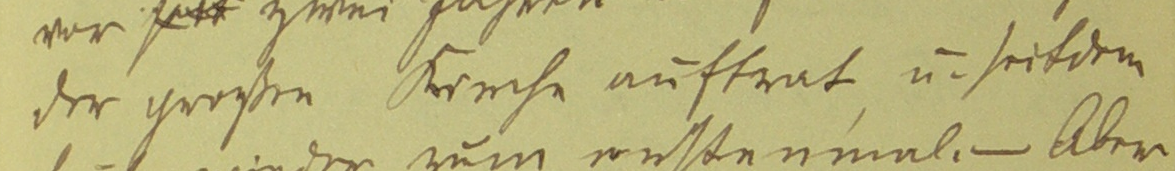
der großen Kirche auftrat, und seitdem
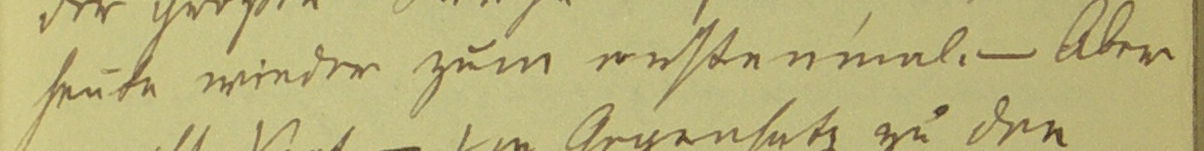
heute wieder zum erstenmal..Aber
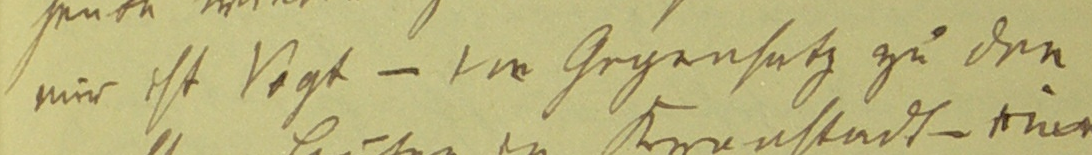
mir ist Vogt- im Gegensatz zu den
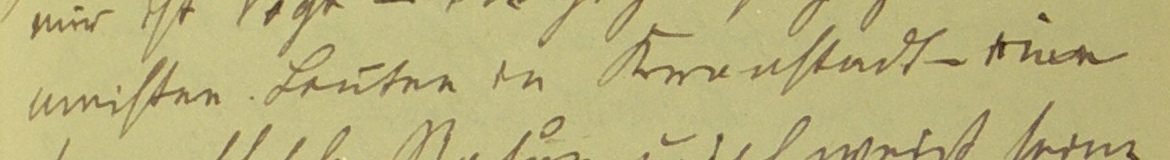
meisten Leuten in Kronstadt-eine
